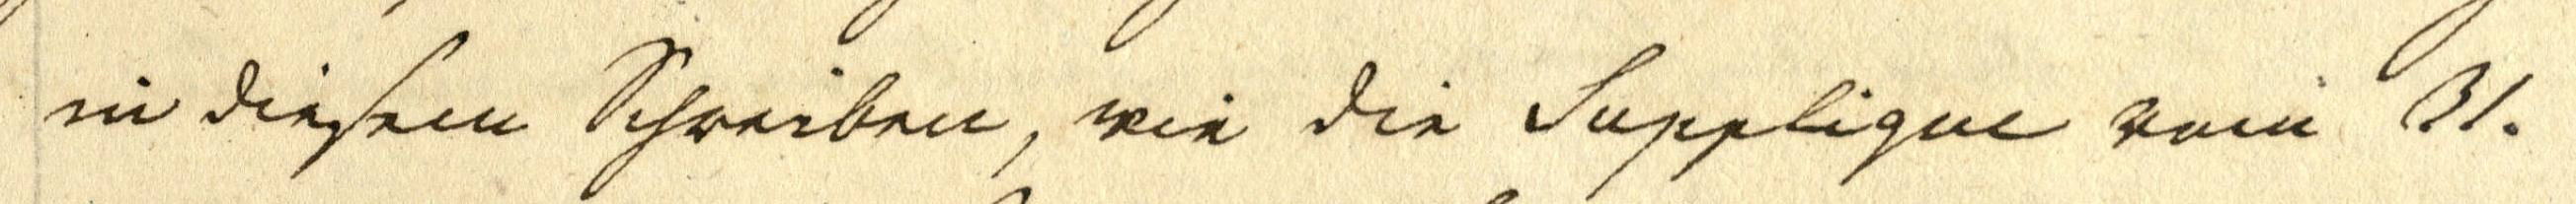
in diesem Schreiben, wie die Supplique vom 31.
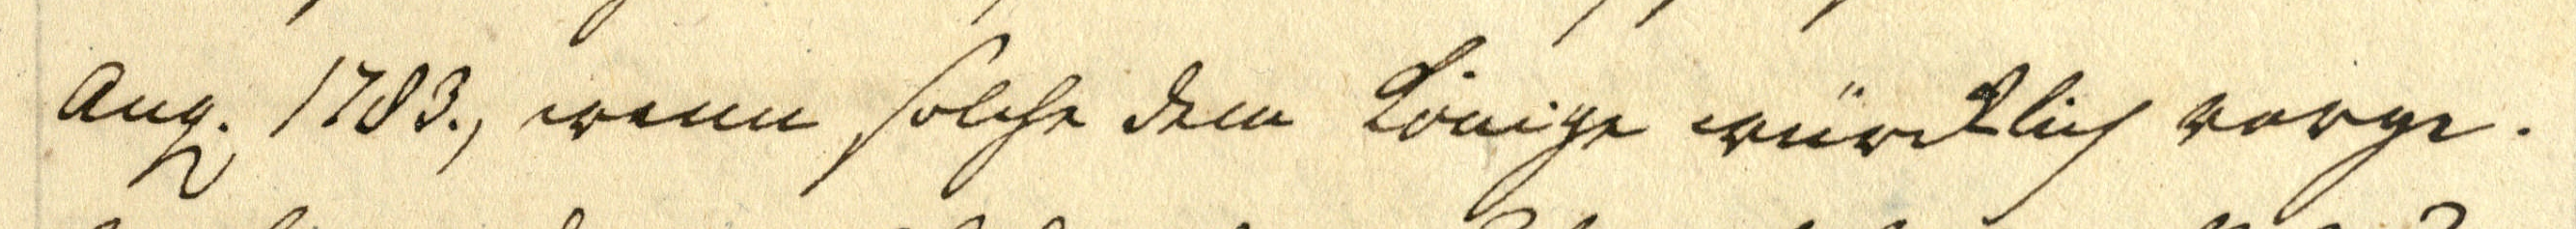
Aug. 1783., wenn solche dem Könige würcklich vorge¬
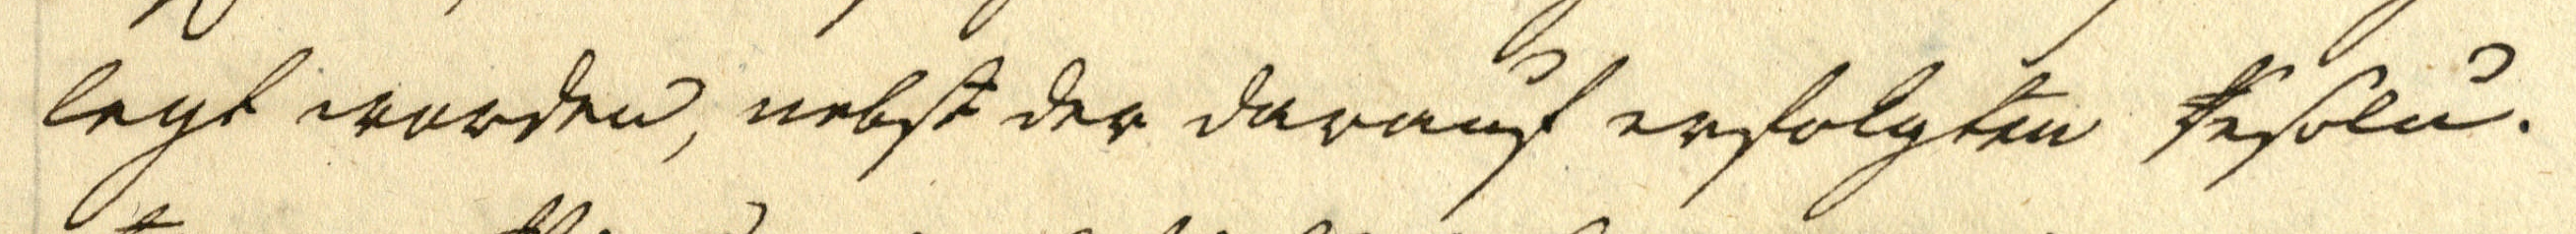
legt worden, nebst der darauf erfolgten Resolu¬
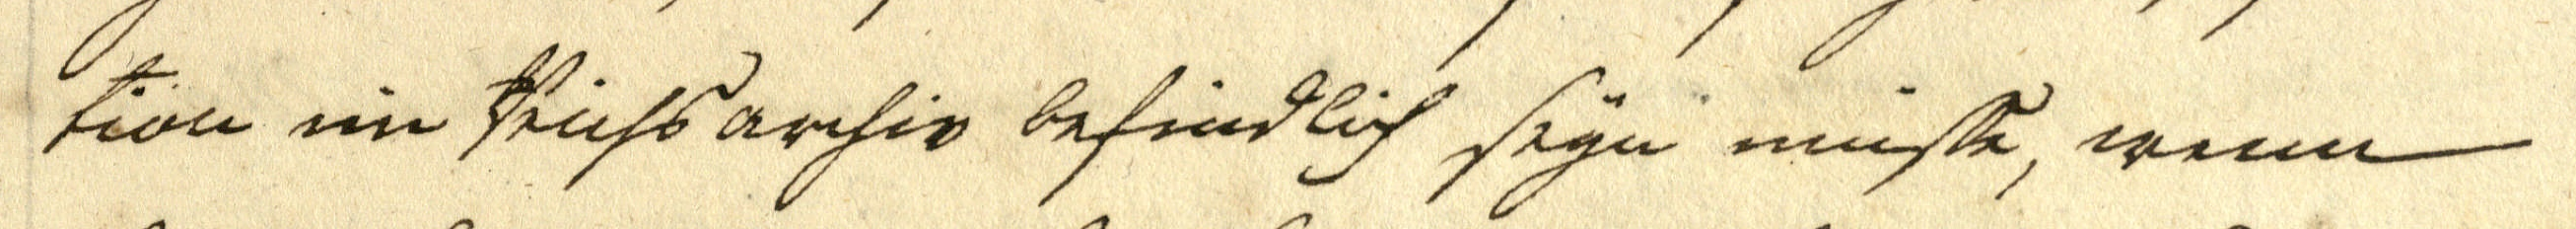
tion im Reichsarchiv befindlich seÿn müsse, wenn
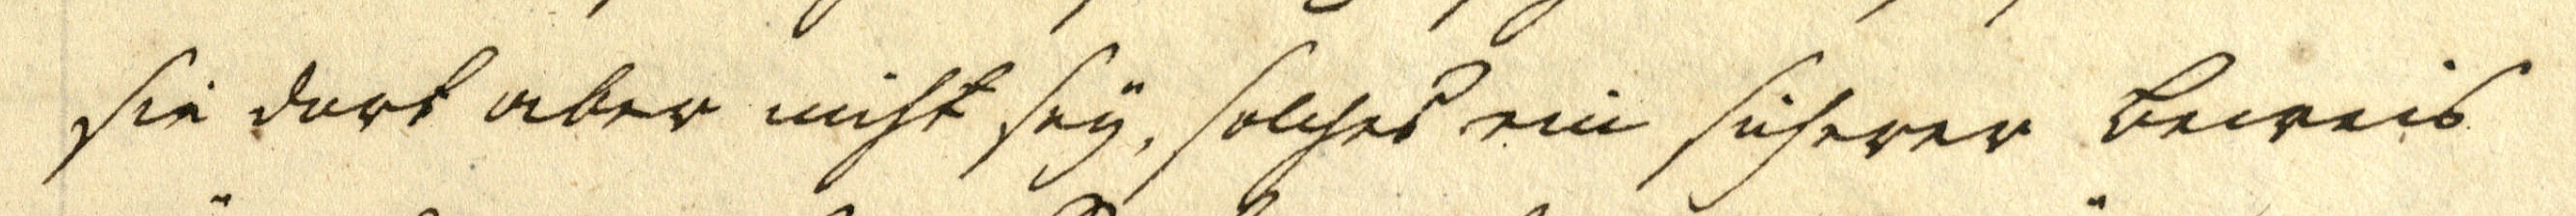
sie dort aber nicht seÿ, solches ein sicherer Beweis
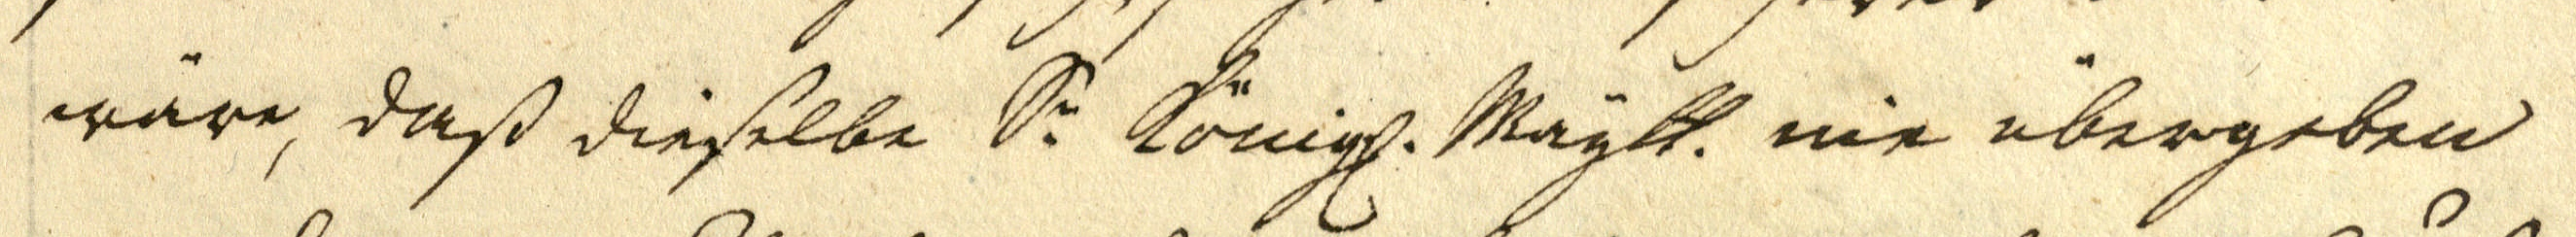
wäre, daß dieselbe Sr. Königl. Maÿtt. nie übergeben
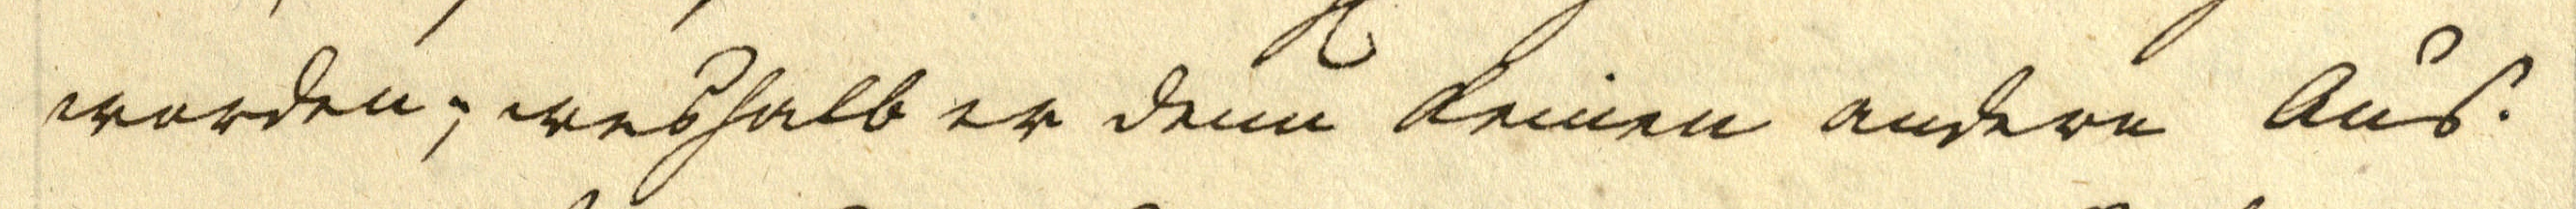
worden, weshalb er denn keinen andern Aus¬
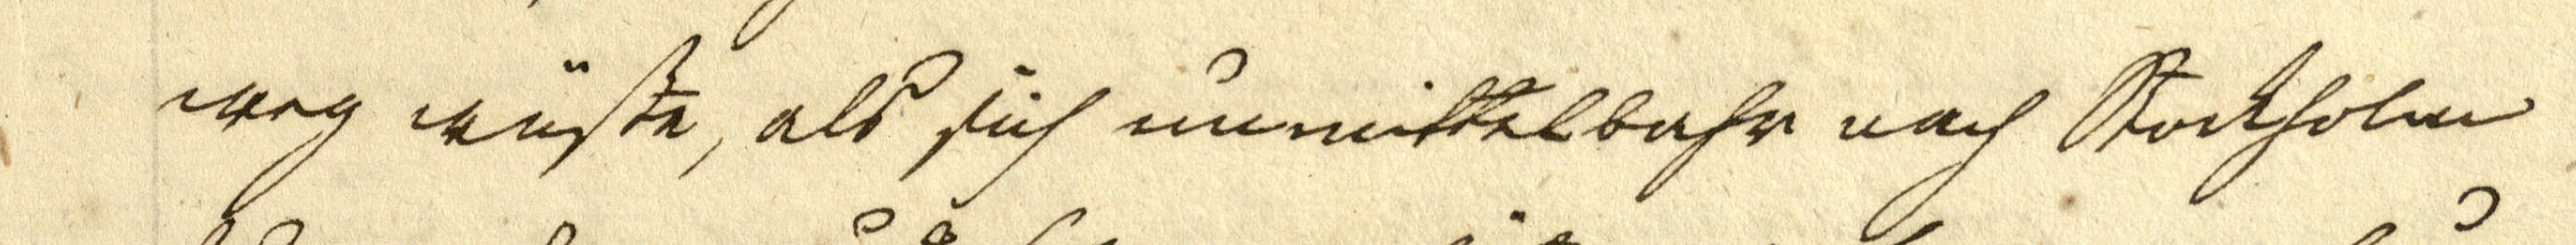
weg wüste, als sich unmittelbahr nach Stockholm
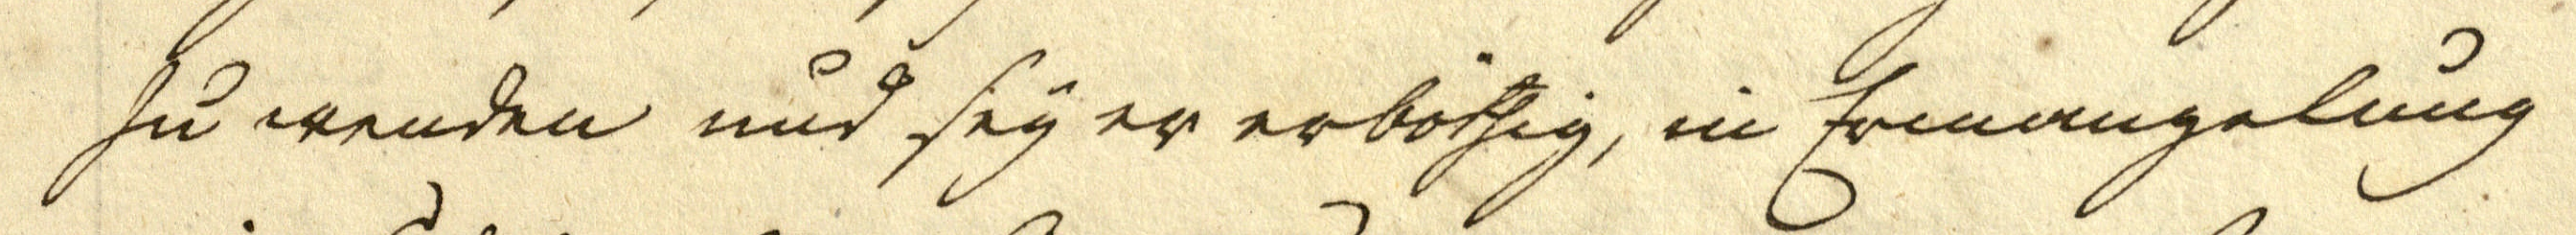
zu wenden und seÿ er erböthig, in Ermangelung
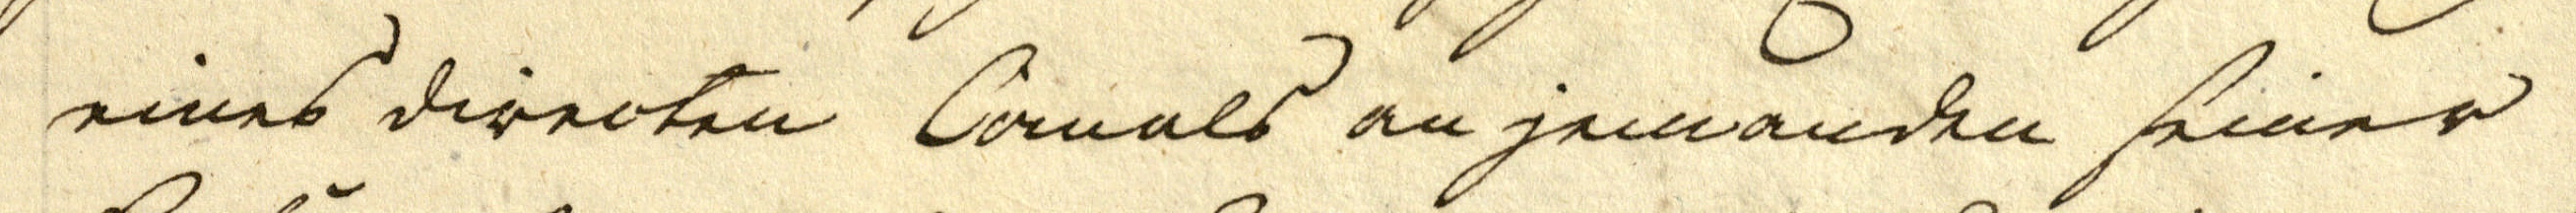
eines directen Canals an jemanden seiner
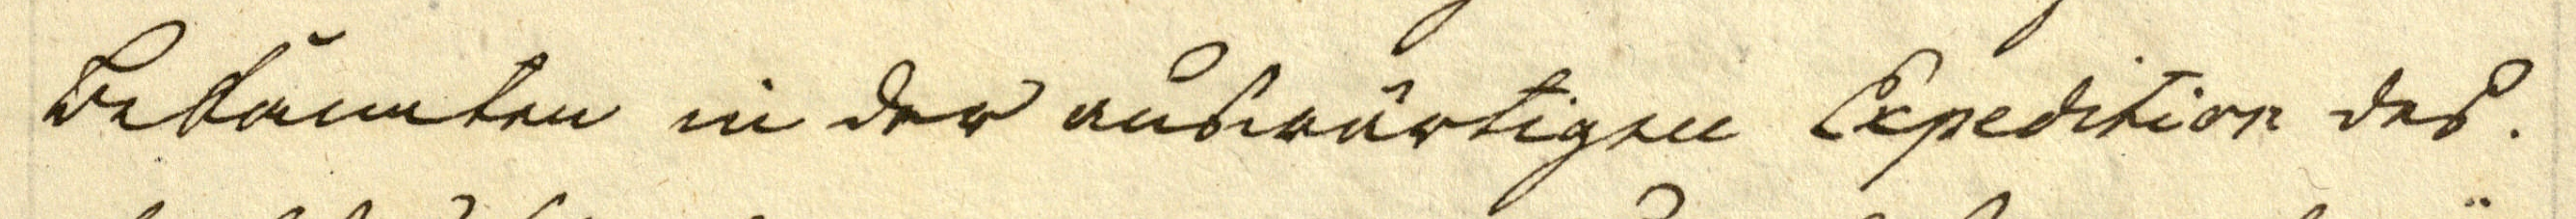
Bekannten in der auswärtigen Expedition des¬
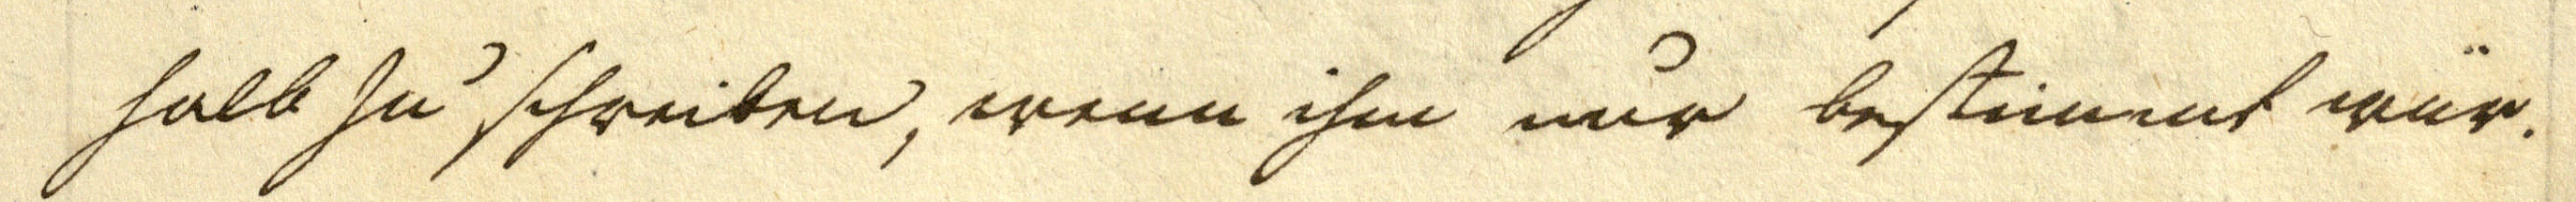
halb zu schreiben, wenn ihm nur bestimmt wür¬
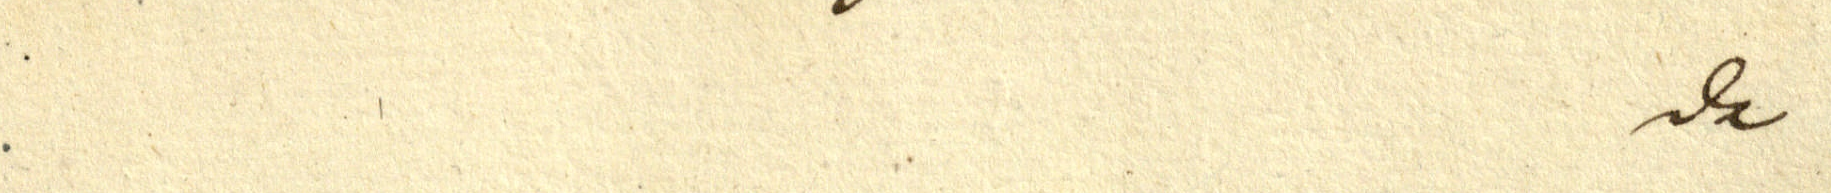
de
